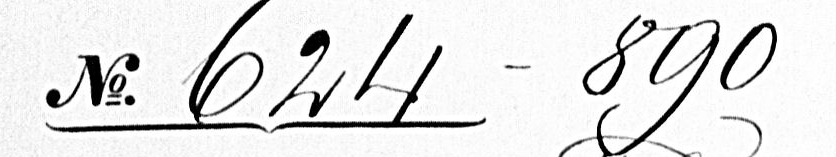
N° 624 - 890
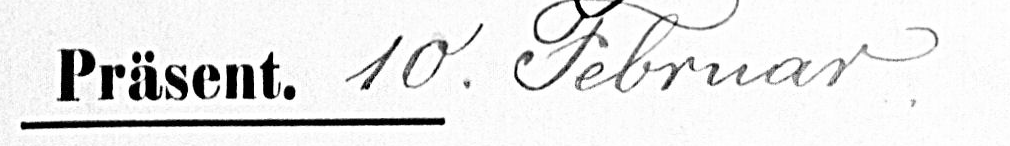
Präsent. 10. Februar.
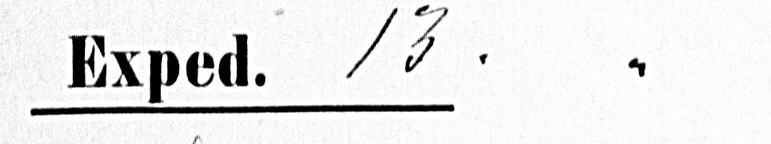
Exped. 13. Februar.
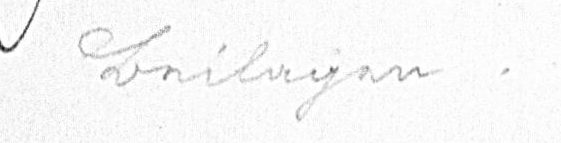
Beilagen.
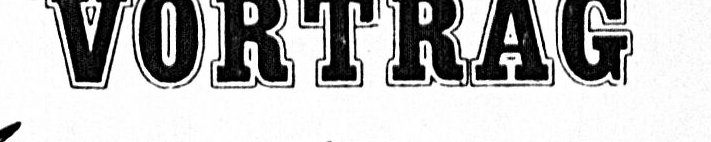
VORTRAG
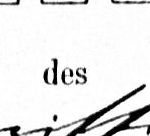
des
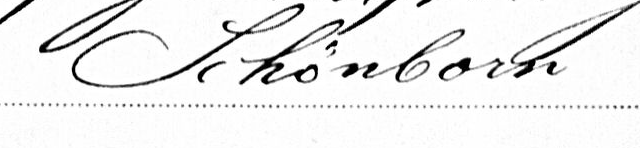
Schönborn
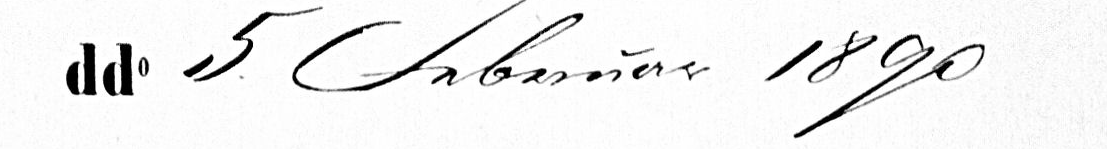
dd 5. Februar 1890
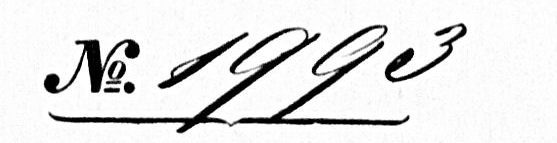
N° 1993
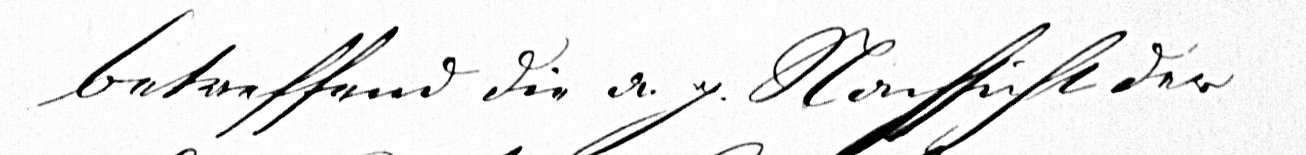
betreffend die a. g. Nachsicht der
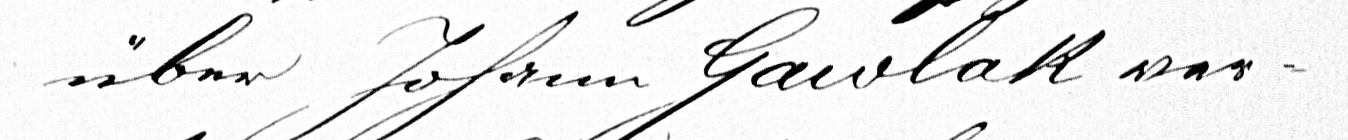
über Johann Gawlak ver¬
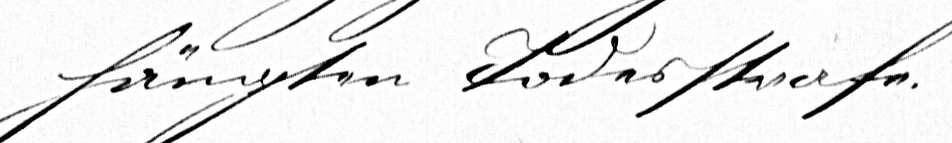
hängten Todesstrafe.
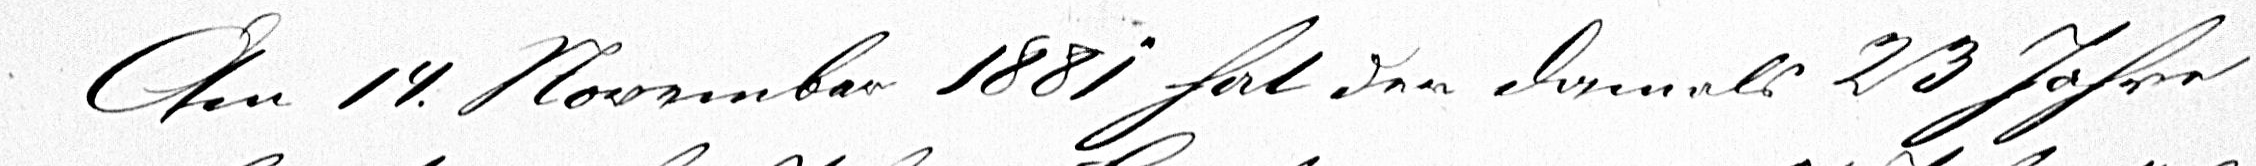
Am 14. November 1881 hat der damals 23 Jahre
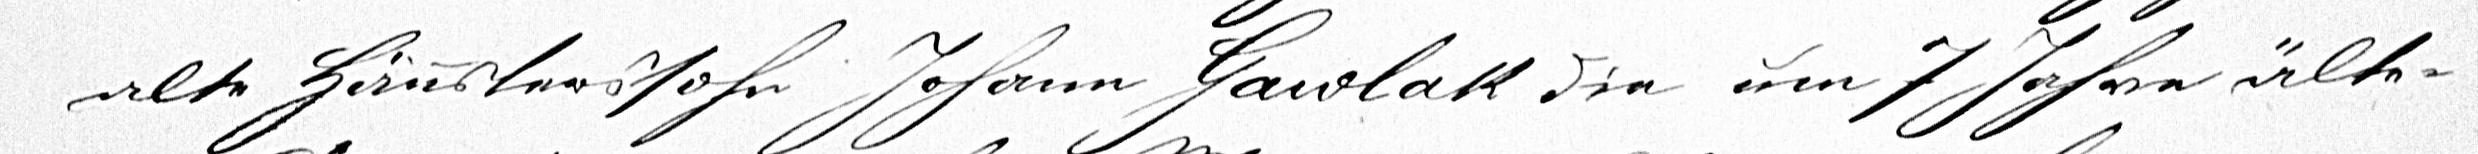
alte Häuslerssohn Johann Gawlak die um 7 Jahre älte¬
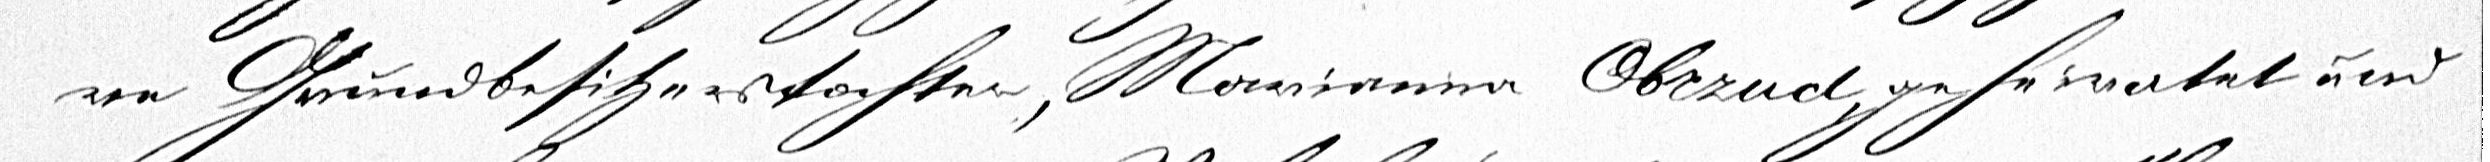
re Grundbesitzerstochter, Marianna Obrzud, geheiratetund¬
